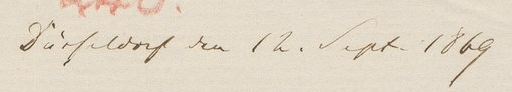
Düsseldorf den 12. Sept. 1869
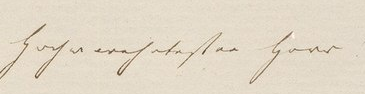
Hochverehrtester Herr!
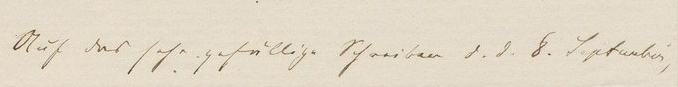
Auf das sehr gefällige Schreiben d. d. 8. September,
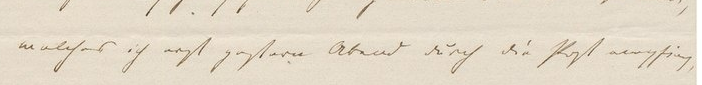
welches ich erst gestern Abend durch die Post empfieng,
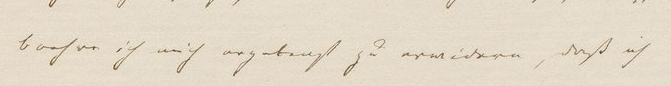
beehre ich mich ergebenst zu erwidern, daß ich
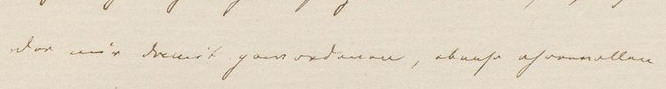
der mir damit gewordenen, ebenso ehrenvollen
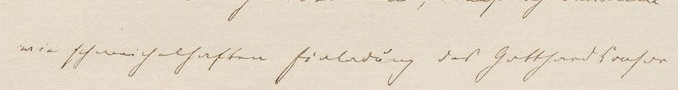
wie schmeichelhaften Einladung des GotthardConsor-
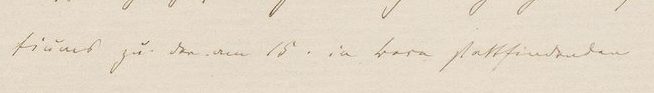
tiums zu den am 15. in Bern stattfindenden
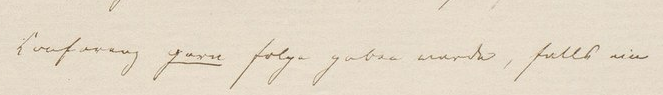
Conferenz gern Folge geben werde, falls ein
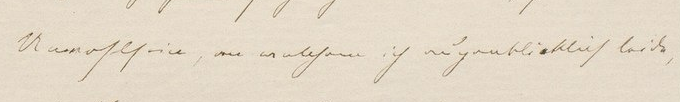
Unwohlsein, an welchem ich augenblicklich leide,
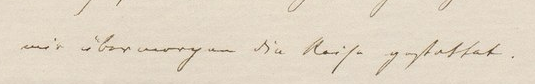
mir übermorgen die Reise gestattet.
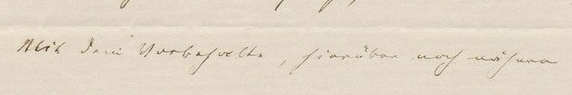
Mit dem Vorbehalte, hierüber noch nähere
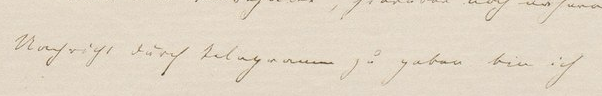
Nachricht durch Telegramm zu geben bin ich
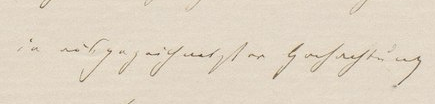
in ausgezeichnetster Hochachtung
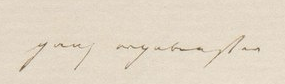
ganz ergebenster
